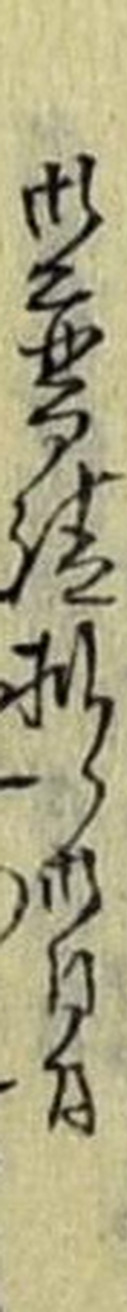御普請掛り御目付
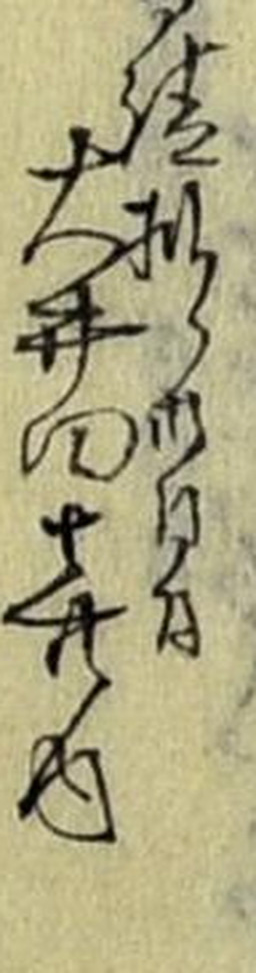大井田喜内
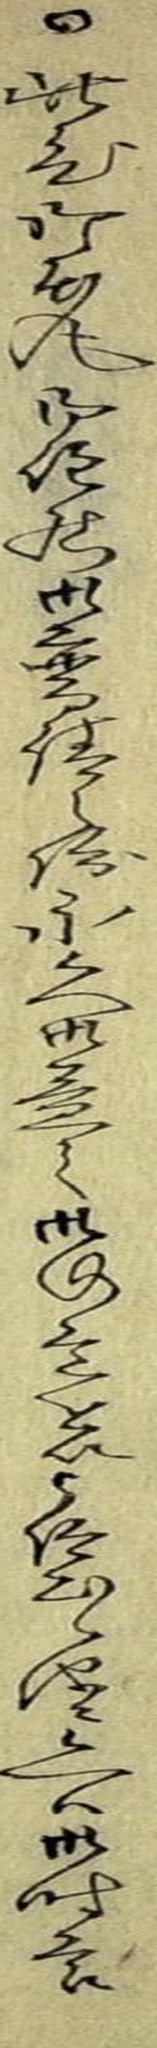○此度御本丸御住居御普請之儀永久御益之御趣意を以被仰出候儀ニ候へハ御時節
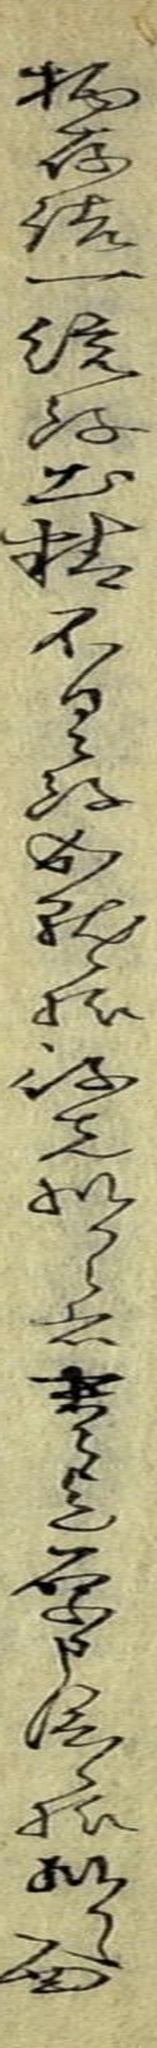柄存詰一統致出精不日ニ致成就候様役先掛り之者末々迄厚申渡候様掛り面
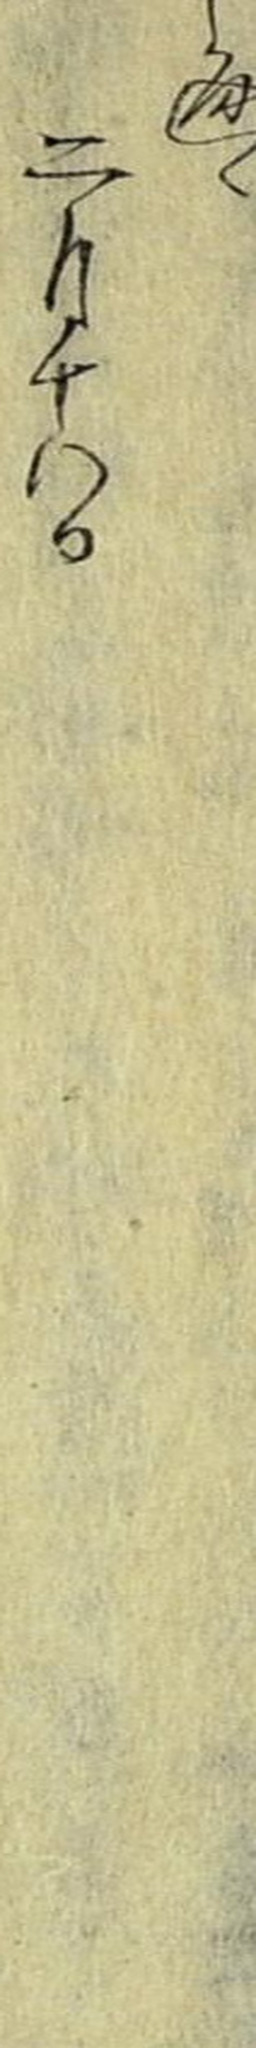二月十八日
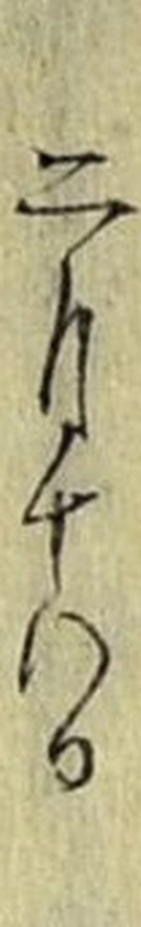二月十八日
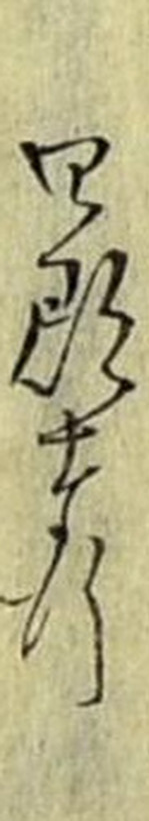四郡奉行
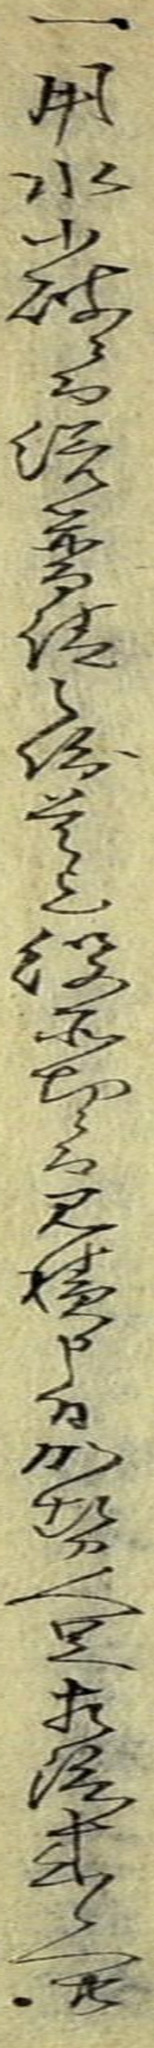一用水小破ニ而繕普請之儀是迄役所切ニ而見積申付加勢人足相渡来候へ共
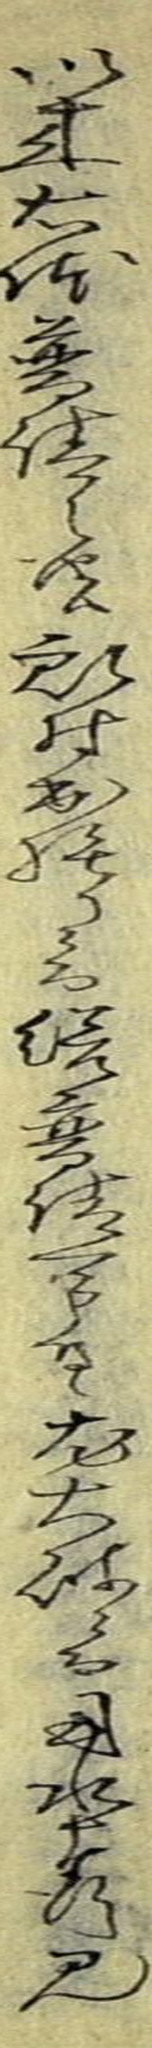以来右体普請之儀ハ願村出張りニ而繕普請可申付候尤大破ニ而用水奉行見
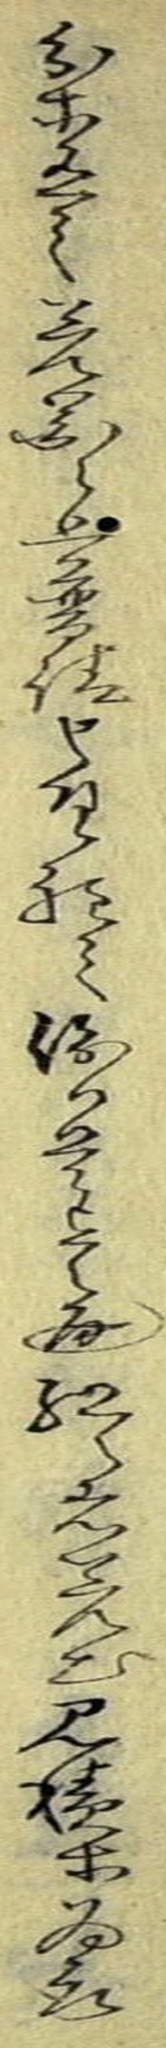分等有之差図之上普請申付候難之儀ハ是迄之通組之者差出見積等為取

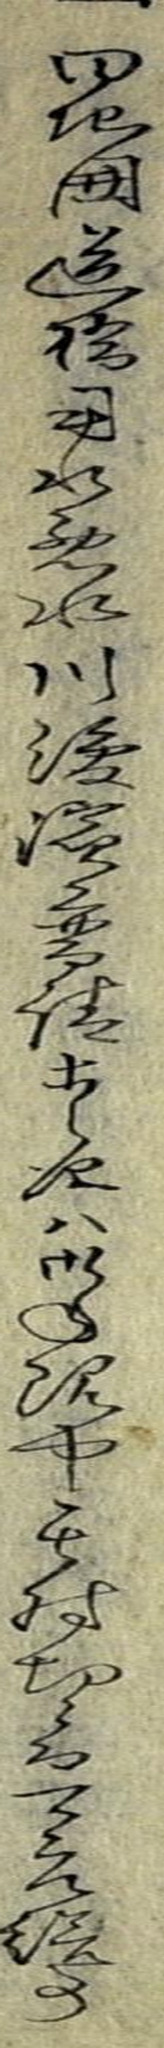一田地囲道橋用水悪水川浚浜普請等之儀ハ御年限中其村切ニ而可取繕事
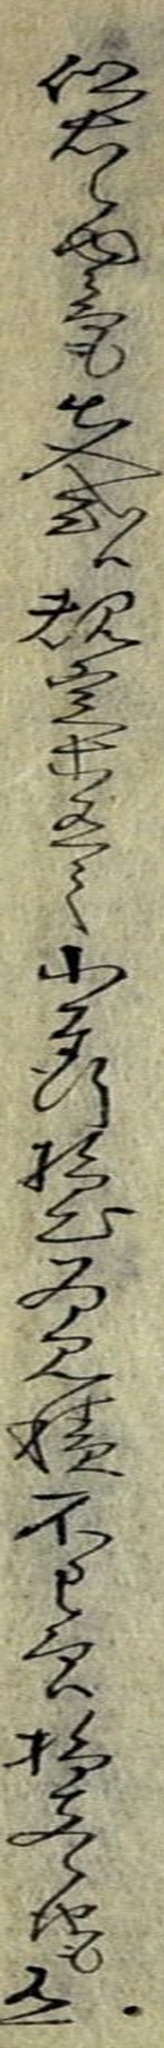但右之内ニ而も出入或ハ規定等有之小奉行指出為見積不申而ハ指支候儀も有
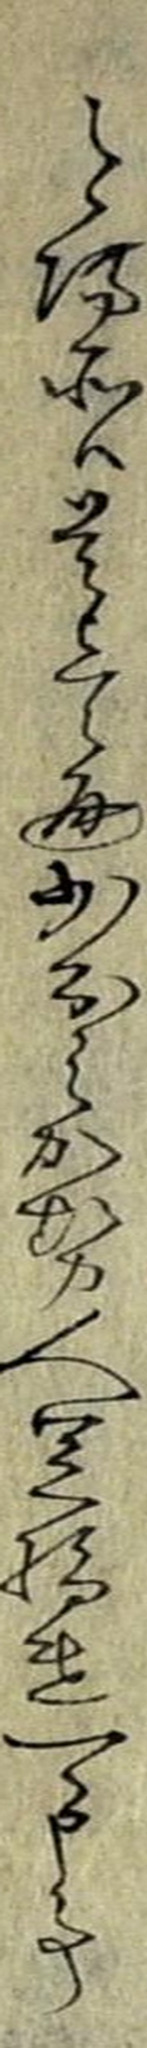之候場所ハ是迄之通少分之加勢人足指遣可申事
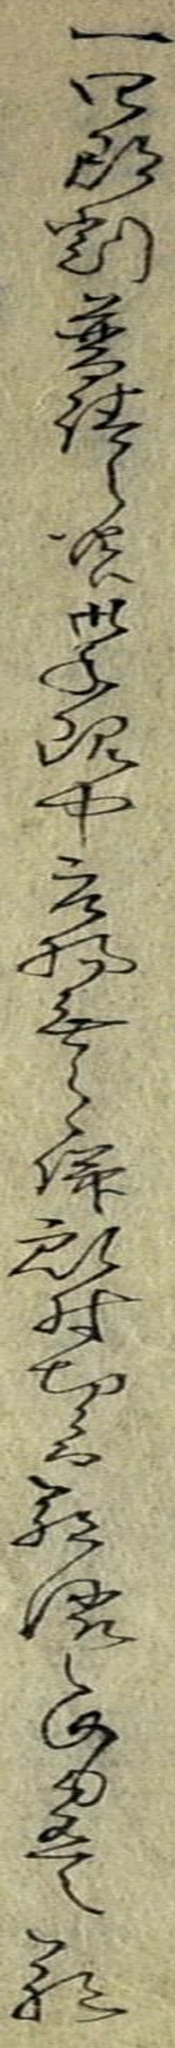一四郡割普請之儀ハ御年限中取揚無之候併郡村切ニ而難渋之趣も有之難
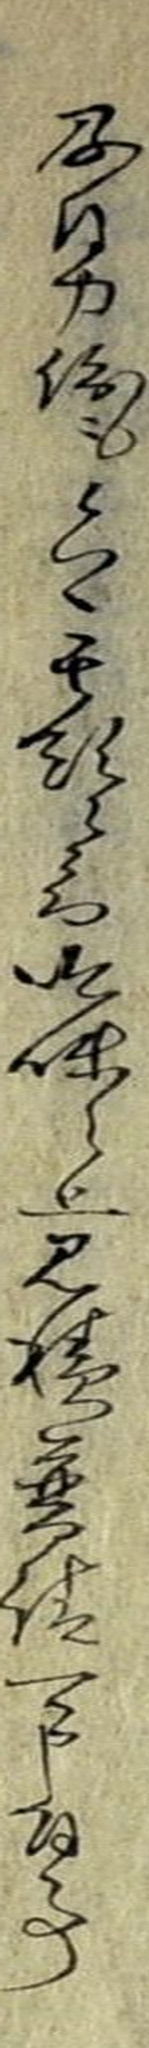及自力儀も候ハヽ其領々ニ而吟味之上見積普請可申付事
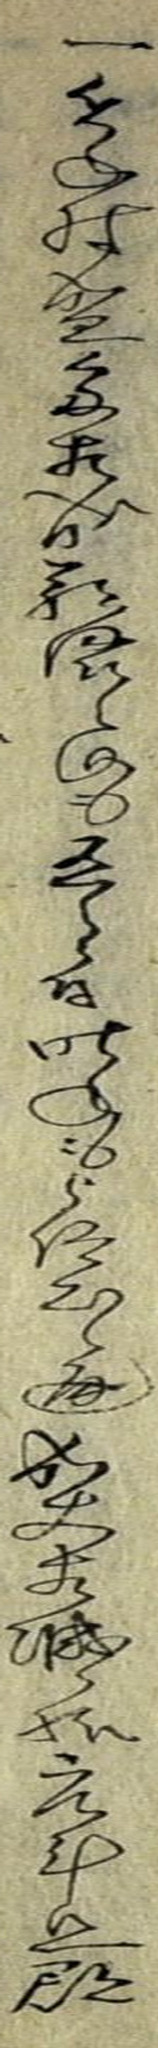一近年村盛多相成難渋之趣も有之ニ付昨年も被仰出候通成丈相減候様取計且郡
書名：命令之部 五
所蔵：福井県文書館 Fukui Prefectural Archives
